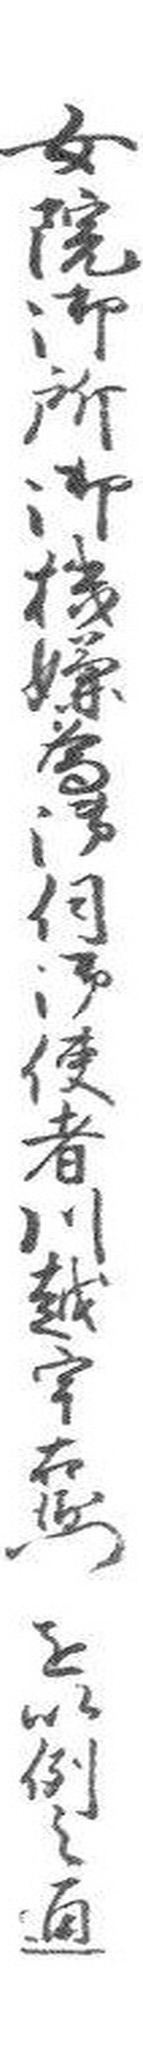女院御所御機嫌為御伺御使者川越宇右衛門を以例之通
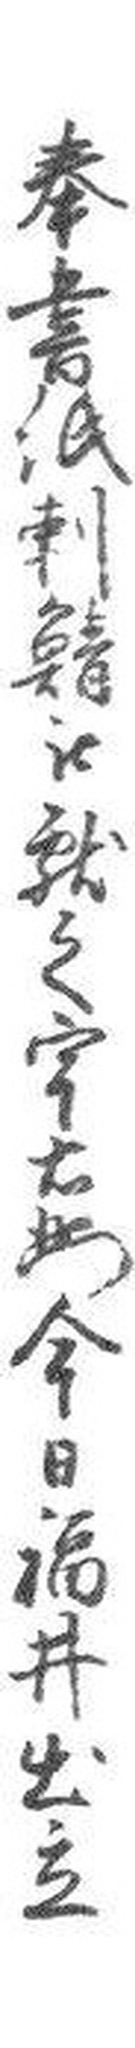奉書紙刺鯖被献之宇右衛門今日福井出立
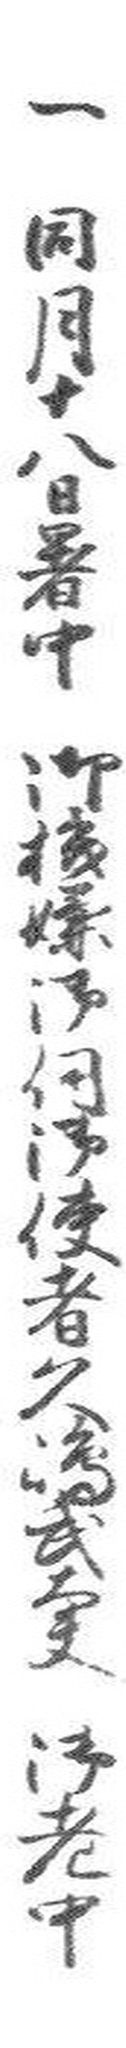一同月十八日暑中御機嫌為御伺御使者久嶋武大夫御老中
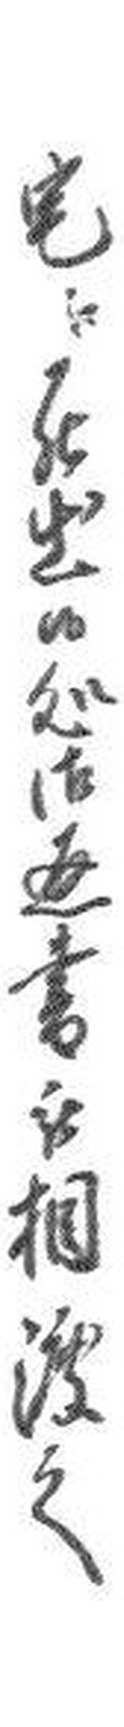宅江罷出候処御返書被相渡之
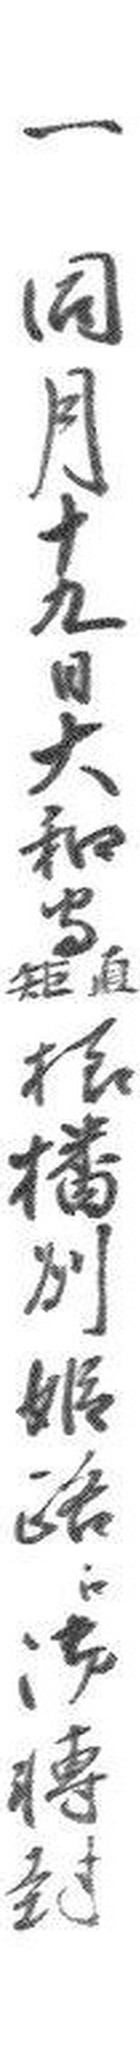一同月十九日大和守直矩様播州姫路江御転封
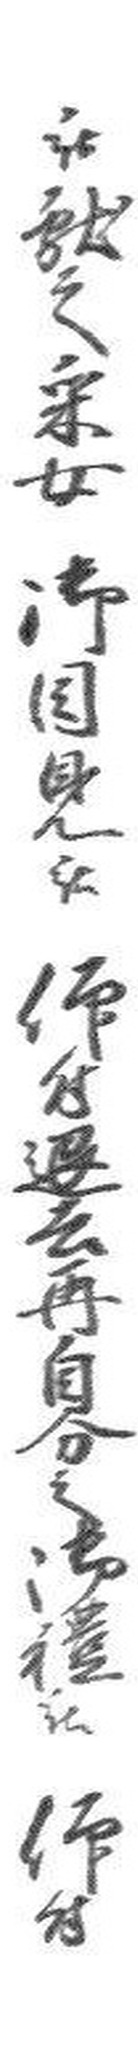被献之采女御目見被仰付退去再自分之御礼被仰付
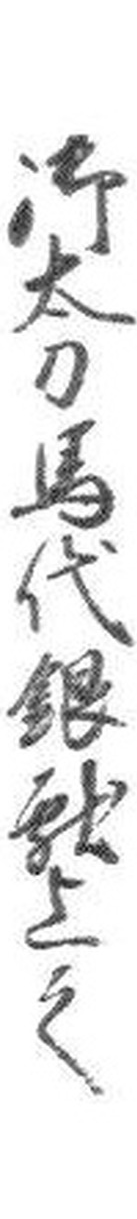御太刀馬代銀献上之
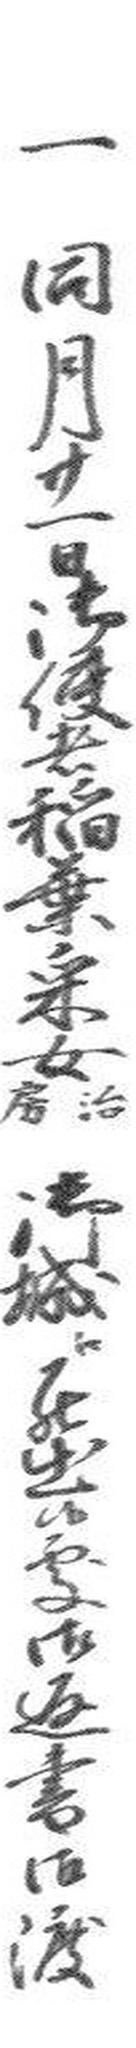一同月廿一日御使者稲葉采女治房御城江罷出候処御返書御渡
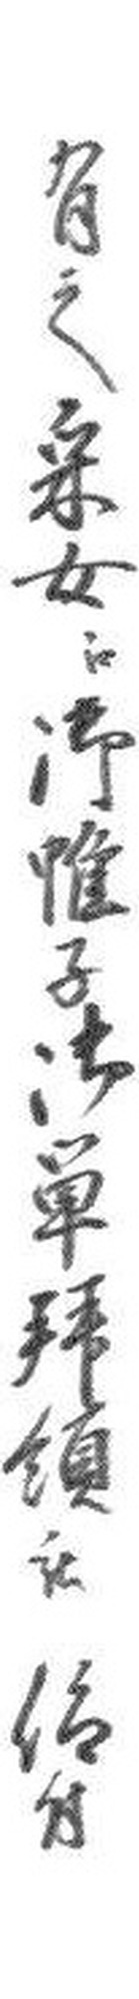有之采女江御帷子御単拝領被仰付
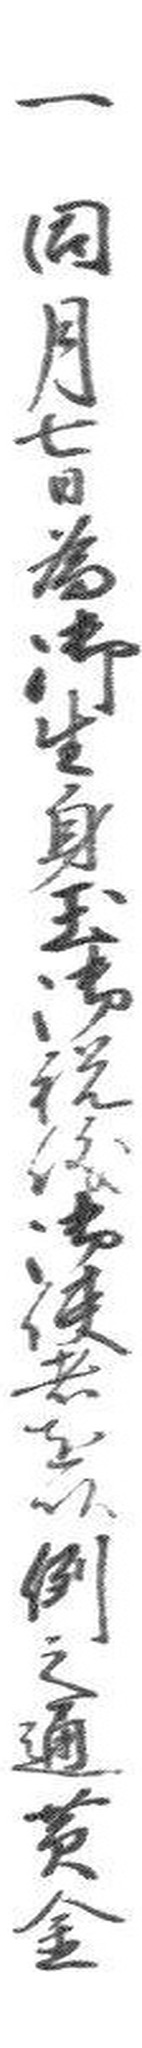一同月七日為御生見玉御祝儀御使者を以例之通黄金

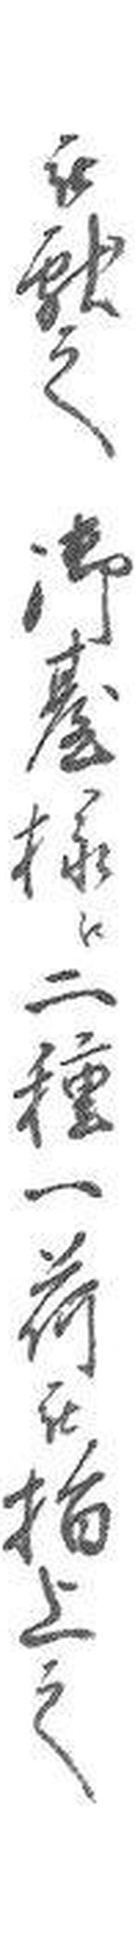被献之御台様江二種一荷被指上之
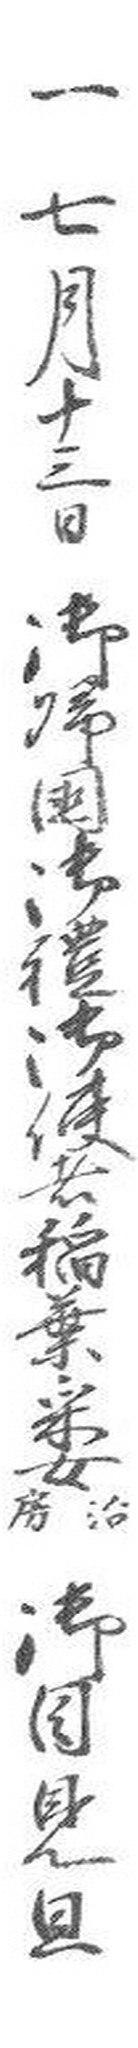一七月十三日御帰国御礼御使者稲葉采女治房御目見且
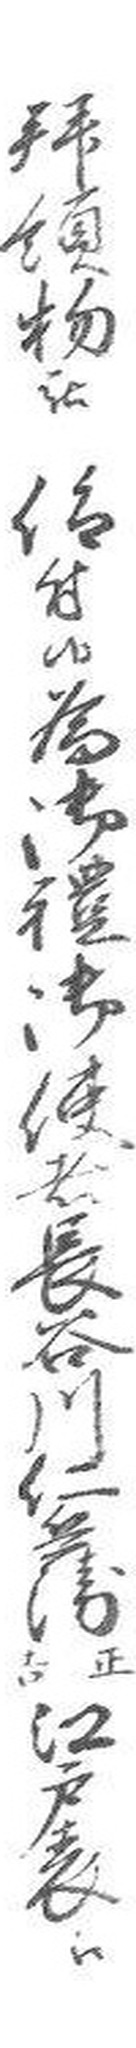拝領物被仰付候為御礼御使者長谷川仁兵衛正吉江戸表江
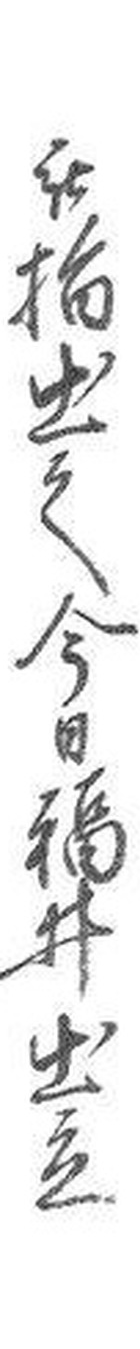被指出之今日福井出立
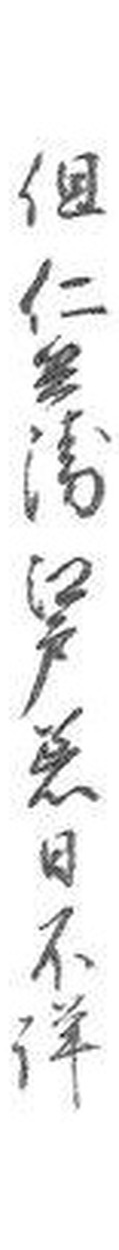但仁兵衛江戸着日不詳
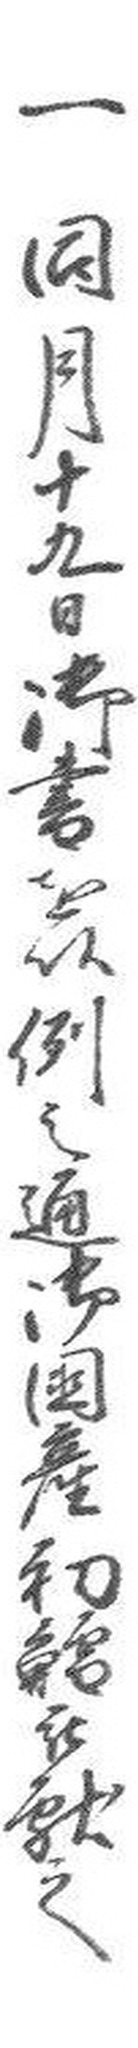一同月十九日御書を以例之通御国産初鱈被献之
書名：家譜 七 光通公 従寛文四年到同九年
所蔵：福井県文書館 Fukui Prefectural Archives
